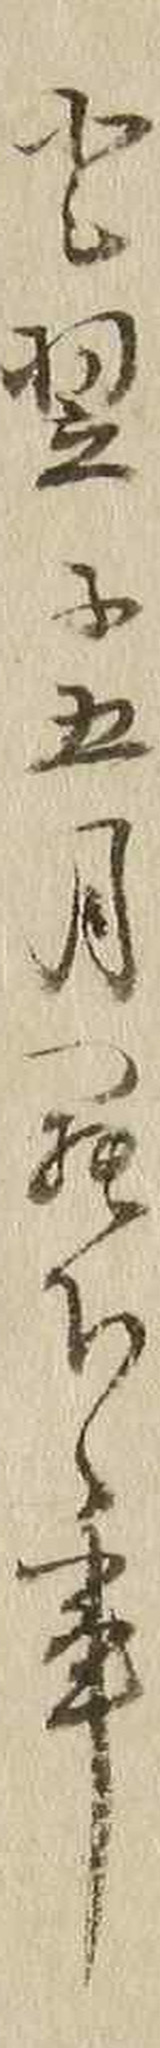登翌子五月罷下候事
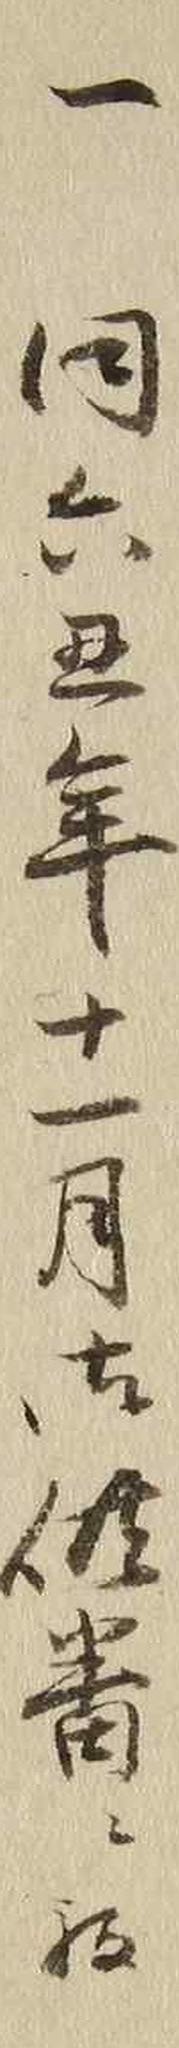一同六丑年十一月御供番ニ被
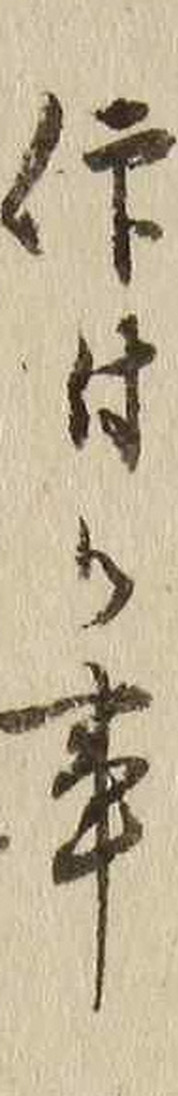仰付候事
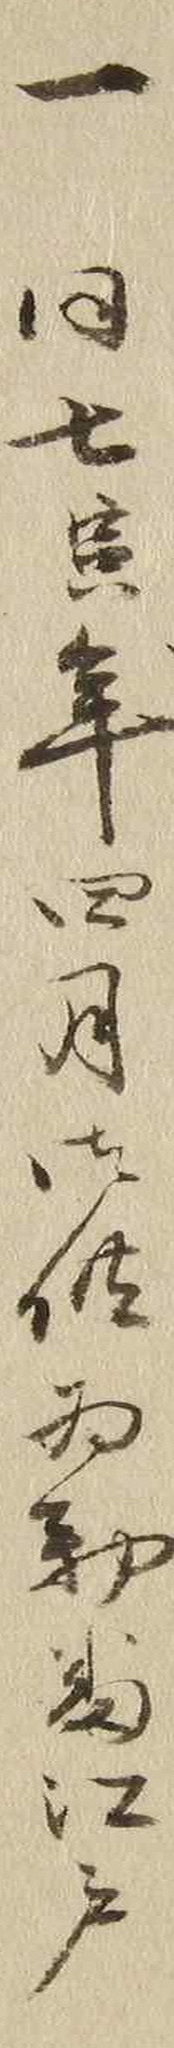一同七寅年四月御供為勤番江戸
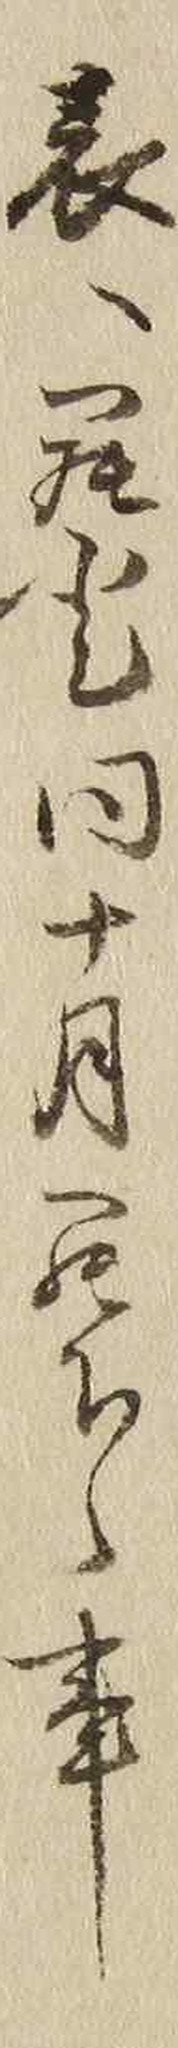表へ罷登同十月罷下候事
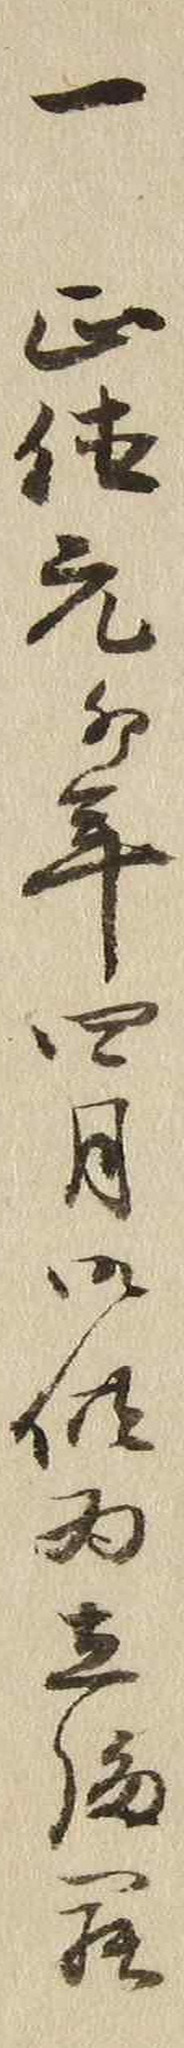一正徳元卯年四月御供為立帰罷
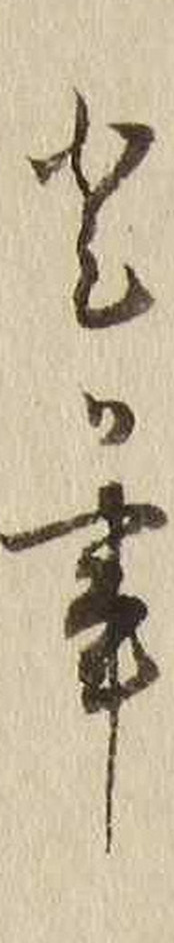登候事
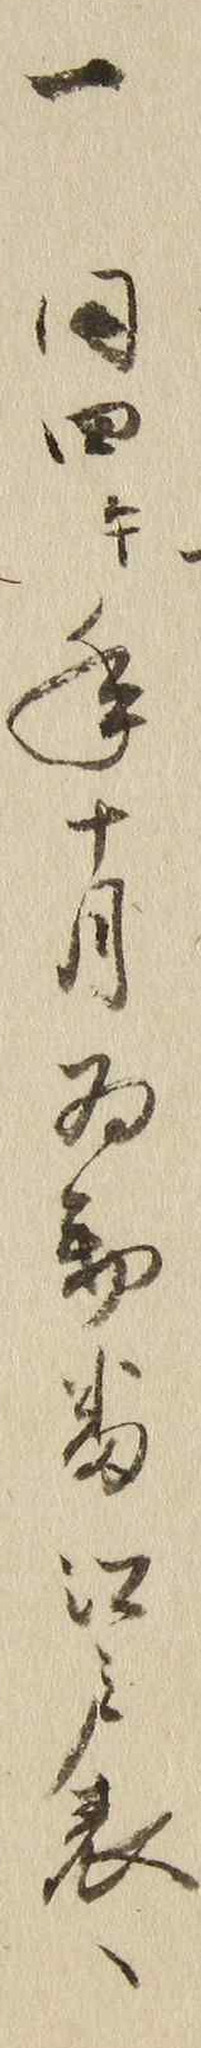一同四午年十月為勤番江戸表へ
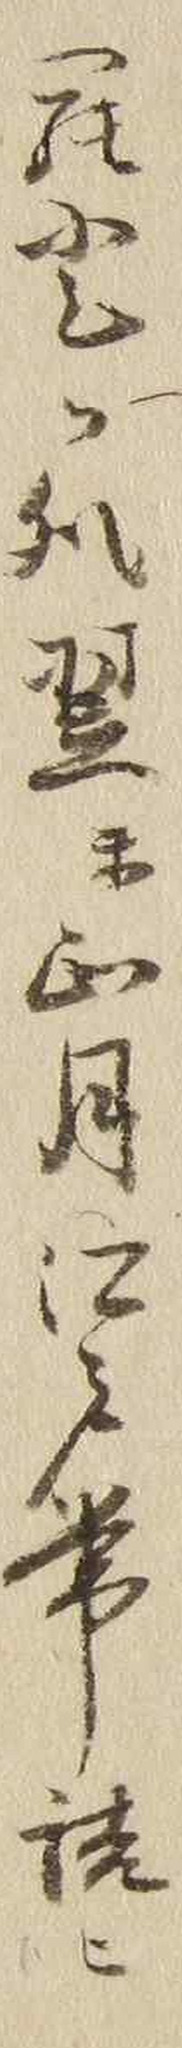罷登候処翌未正月江戸常詰被
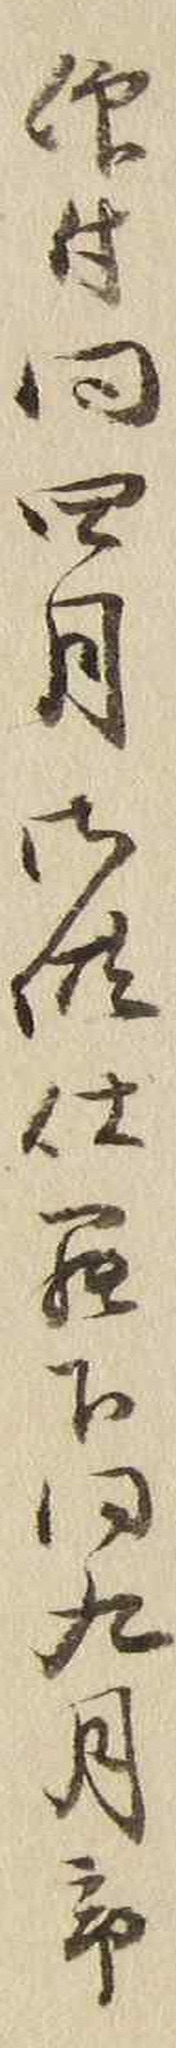仰付同四月御供仕罷下同九月郎
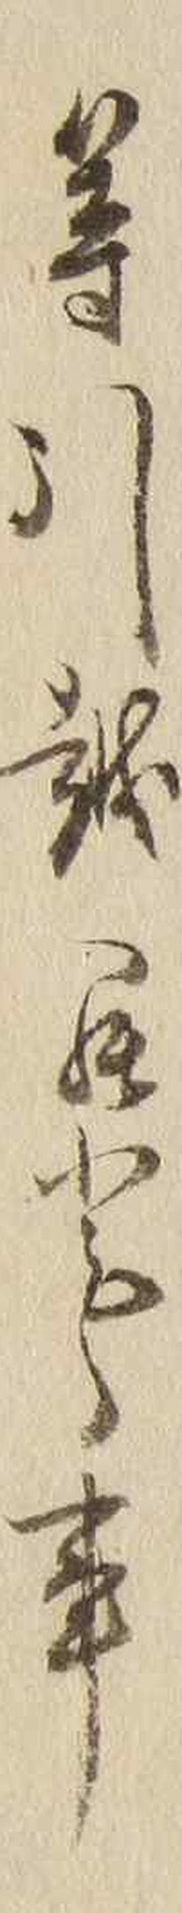等引越罷登候事

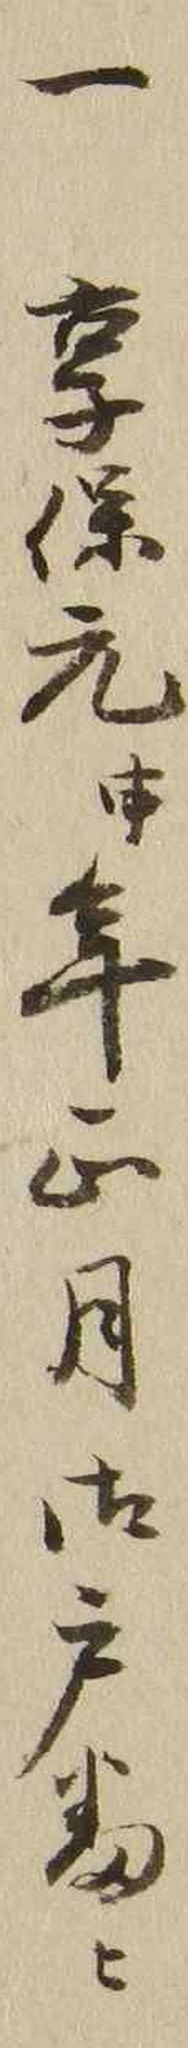一享保元申年正月御戸番被
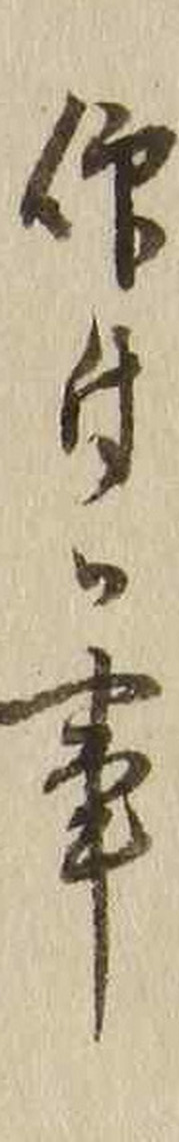仰付候事
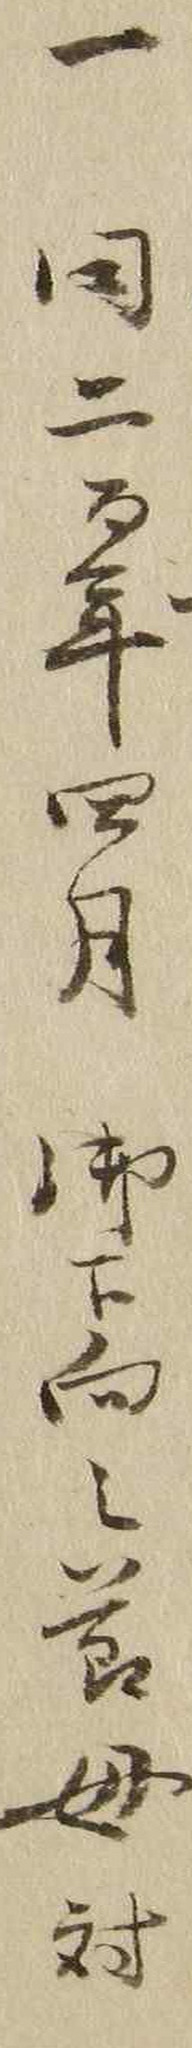一同二酉年四月御下向之節母対
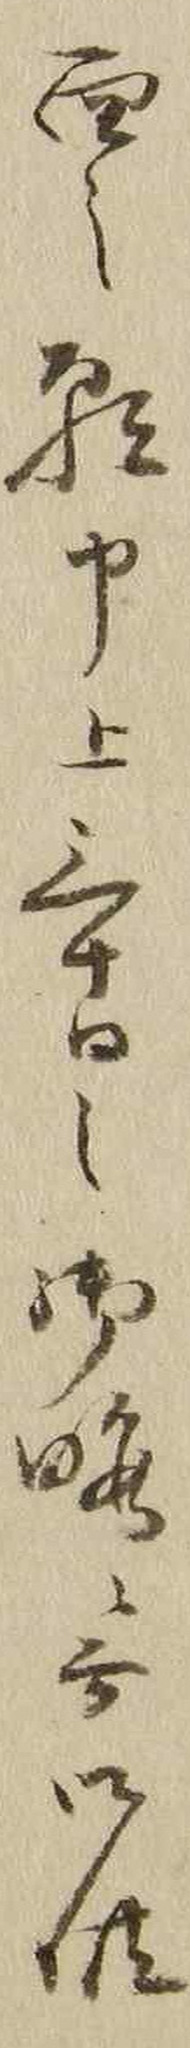面之願申上三十日之御暇ニ而御供
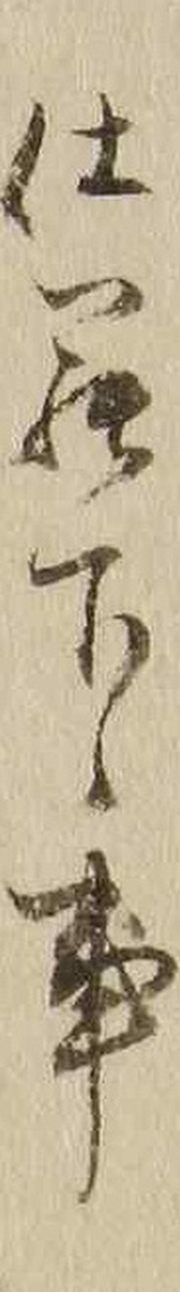仕罷下候事
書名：諸士系譜　巻之225　ま之部6
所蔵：会津若松市立会津図書館
